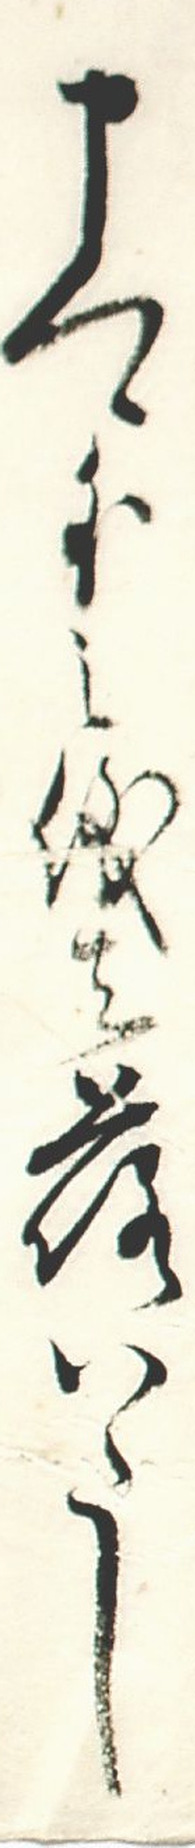申上候外之儀は荷はたし
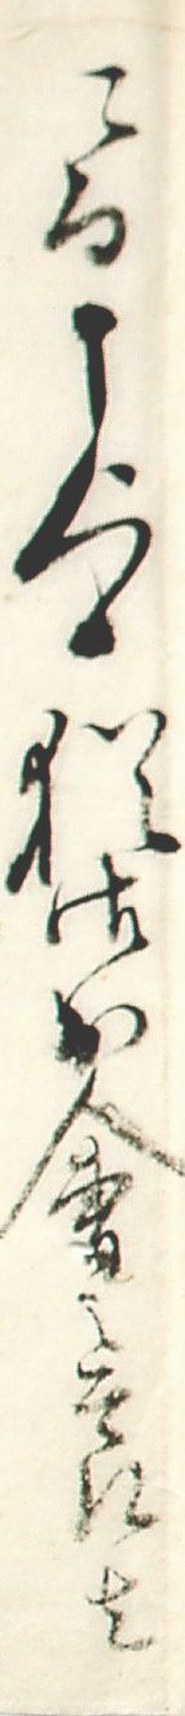に而申上候猶御出会之節は
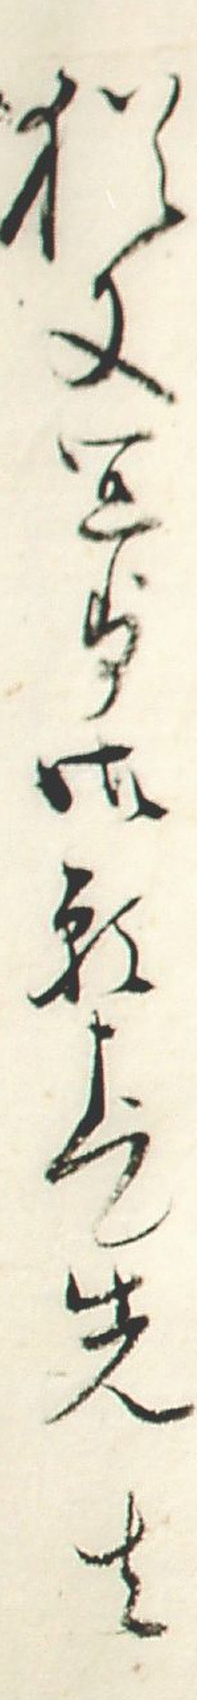猶又宜布御願申上候先は
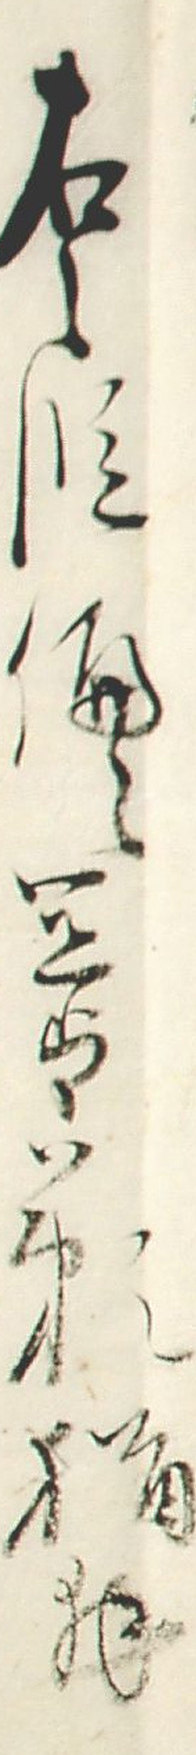右之段偏に宜布御願猶此

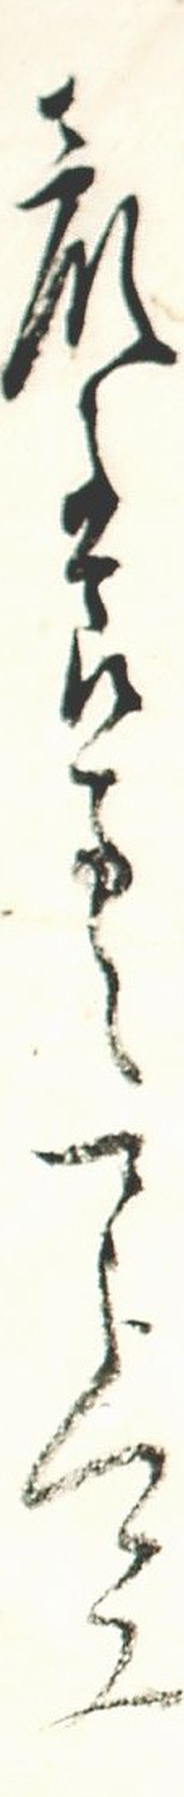着之節色々可申上候以上
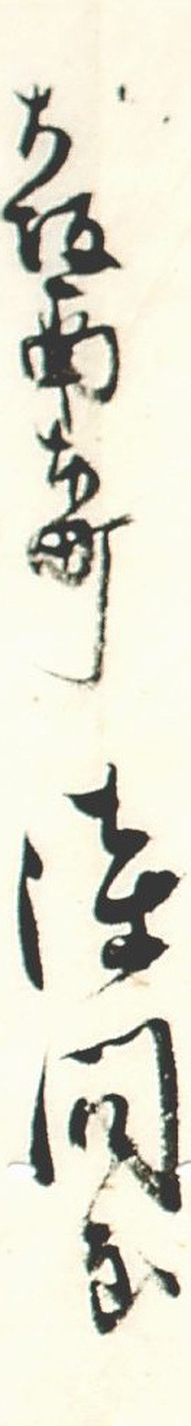大坂南本町漆問屋
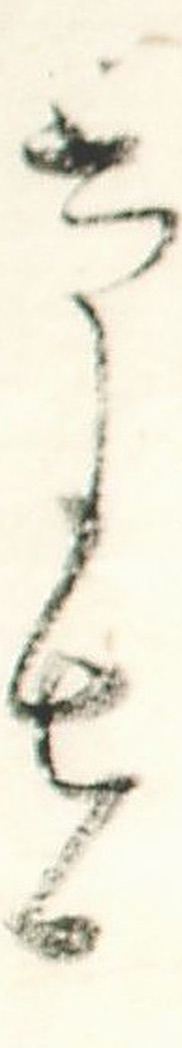六月七日
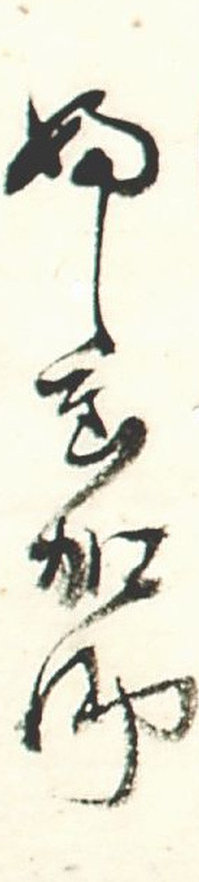ふし屋加助
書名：漆買捌方之事（漆売却約定書）
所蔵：鳴門教育大学 Naruto University of Education
